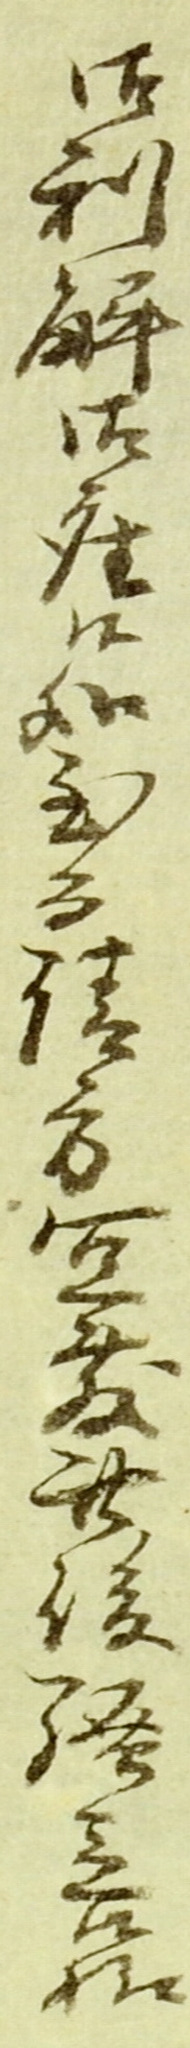御利解御座候処至而請方宜敷此後騒立候様
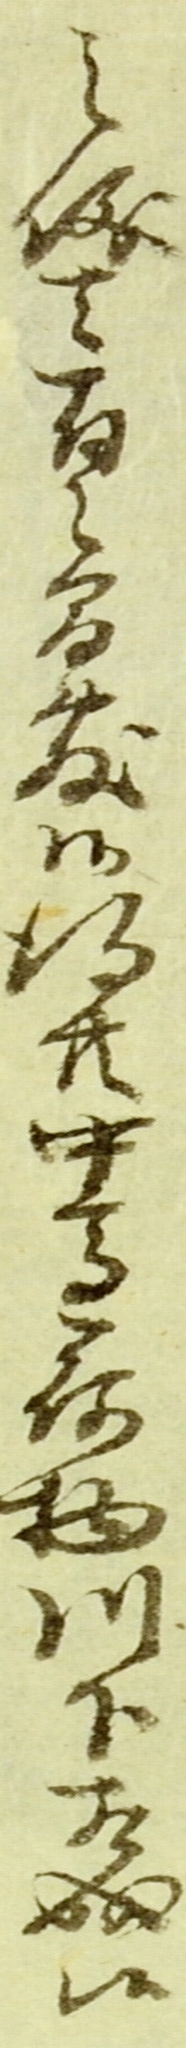之儀は有之間敷候得共中馬荷物川下相成候
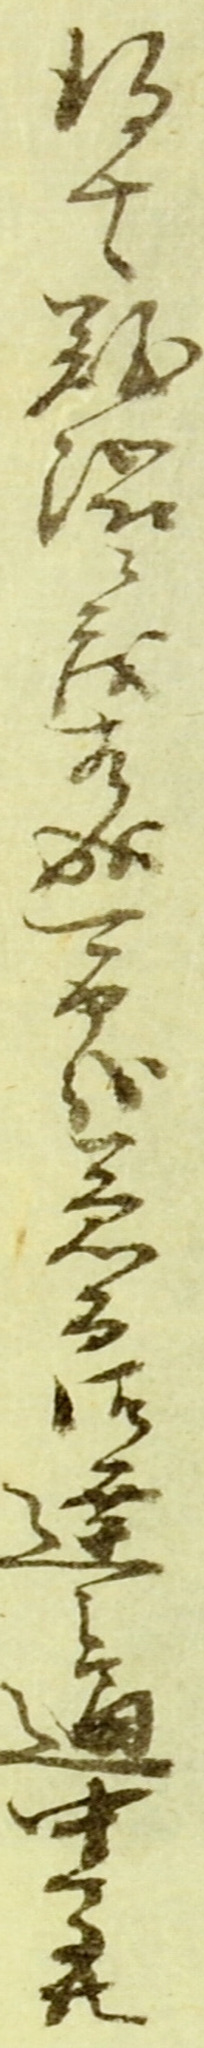得は難渋ニも相成可申哉兼而御達之通中馬共
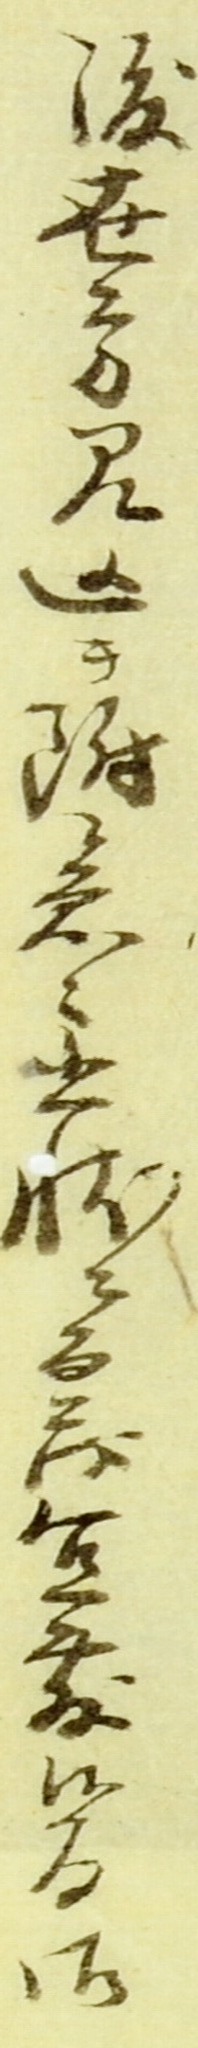渡世方見込ヲ附着々書状ニ而も宜敷候而御

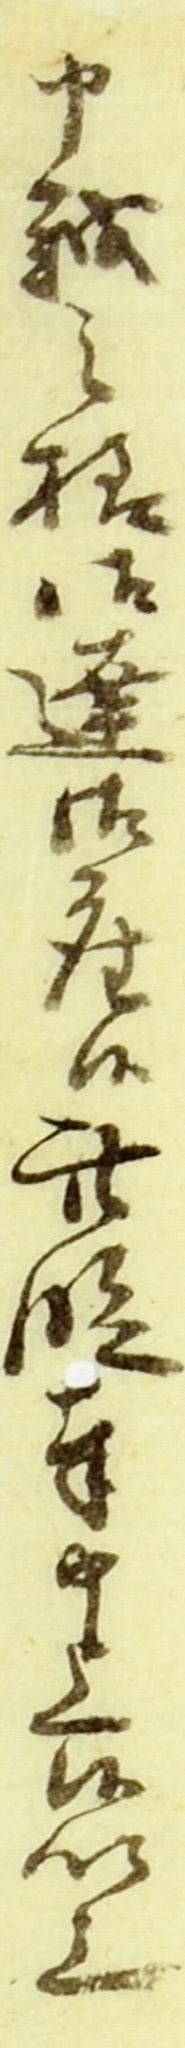申越之様御達御座候此段奉申上候以上
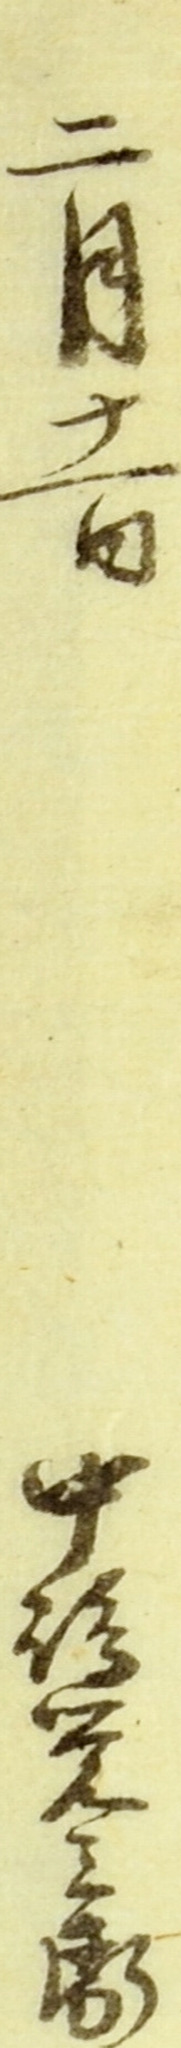二月十一日中嶋覚兵衛
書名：調査報告書
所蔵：伊那市立高遠町図書館・合同会社AMANE
